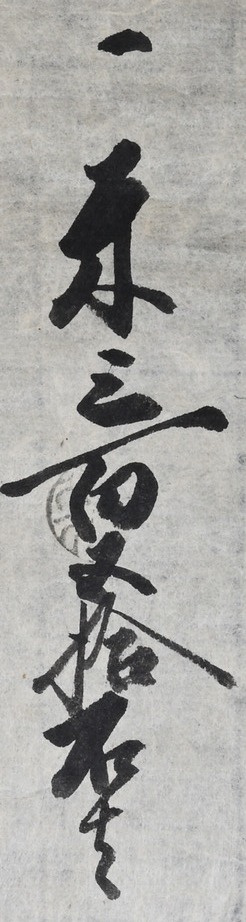一米三百五拾石者
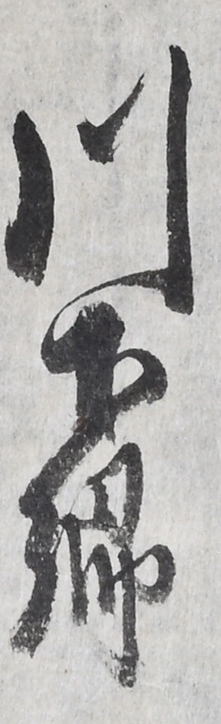川下郷
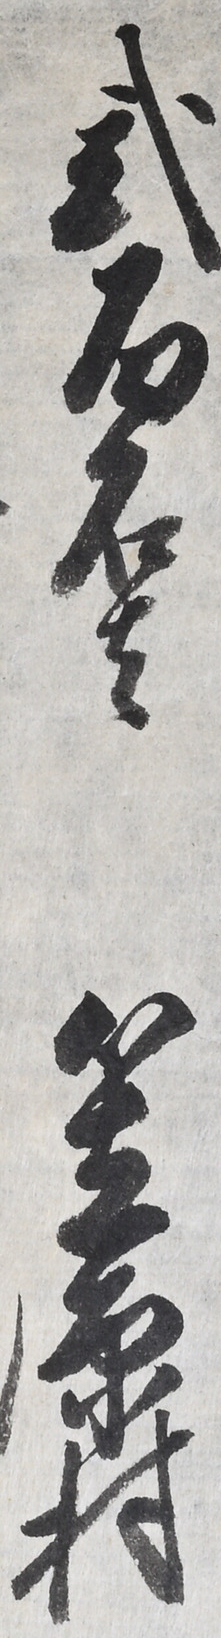弐百石者笠原村
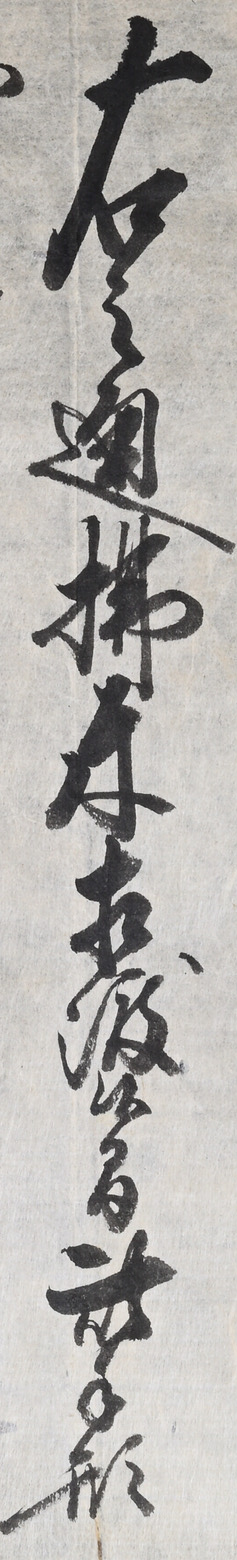右之通払米相渡候間此手形
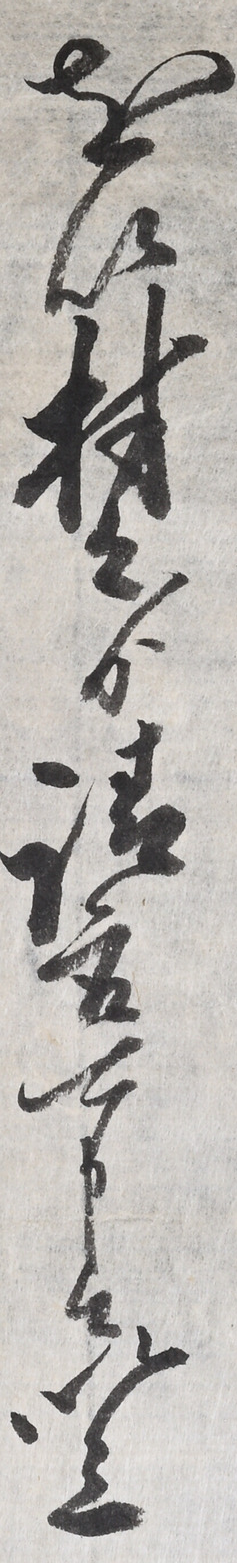を以村々ゟ請取可申候以上
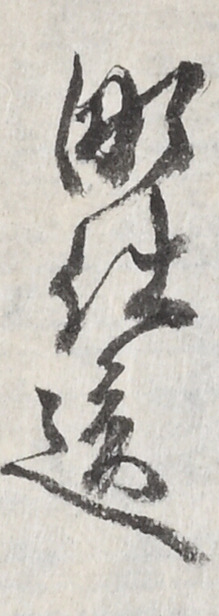町仕送
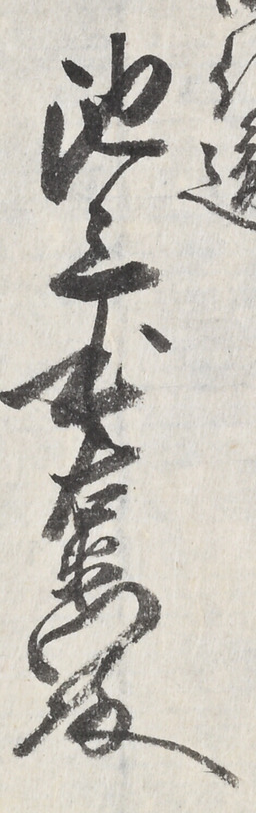池上本右衛門殿
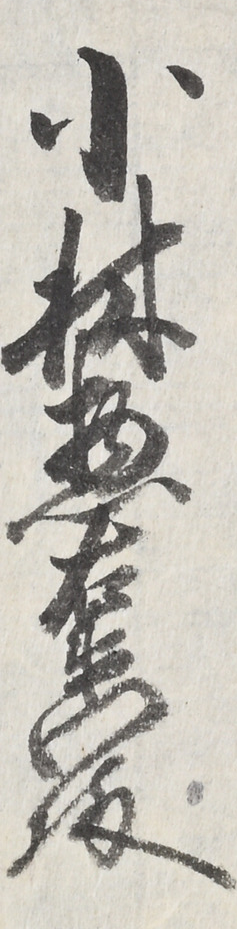小林惣右衛門殿
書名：覺
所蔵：伊那市立高遠町図書館・合同会社AMANE
